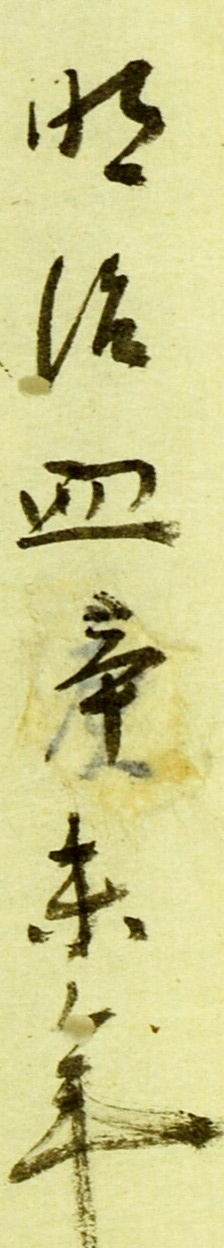明治四辛未年
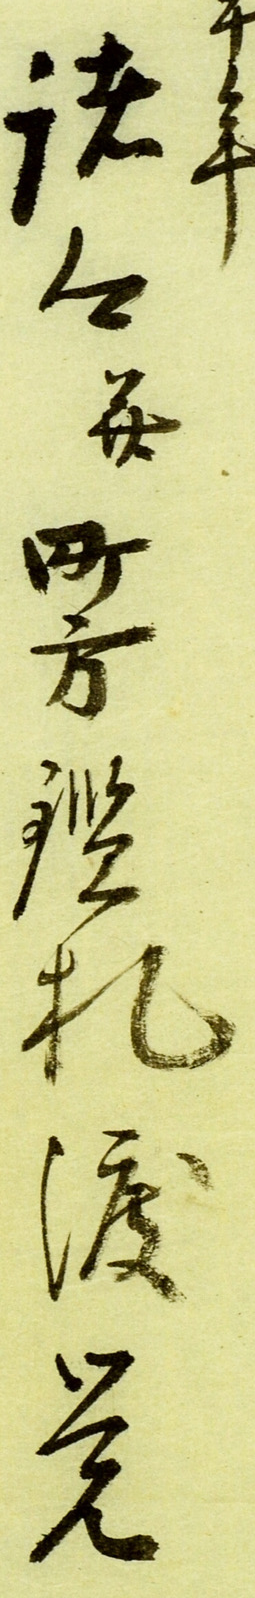諸郷并町方鑑札渡覚

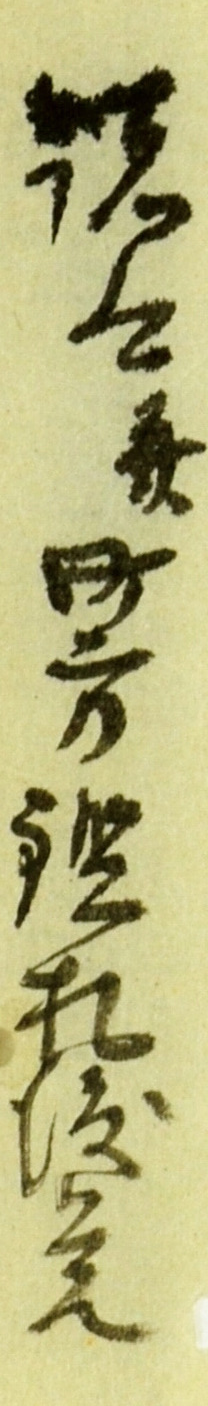諸郷幷町方鑑札渡覚
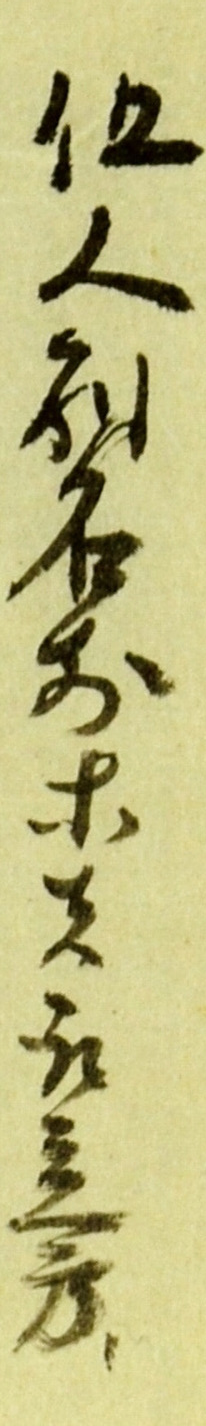但人別名前等物取立方
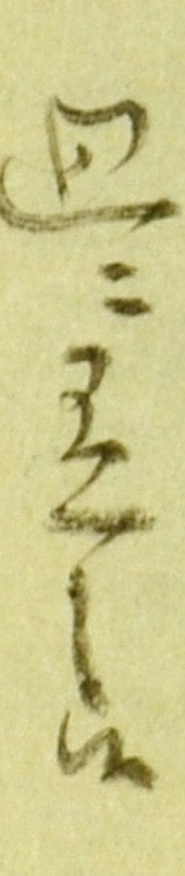廻ニ有之候
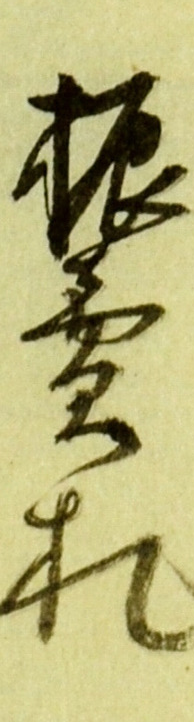振売札
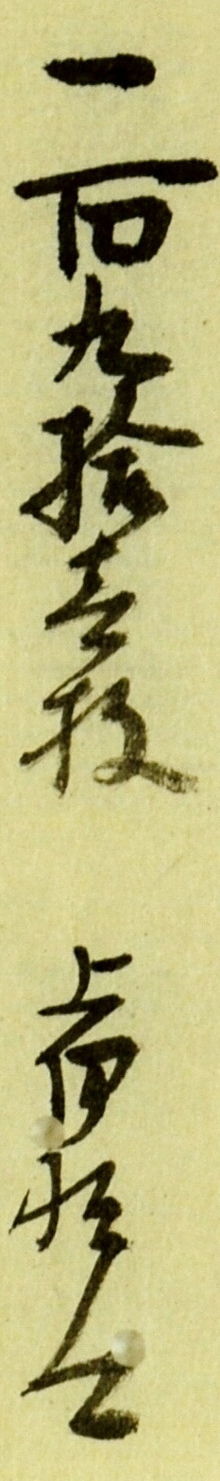一百九拾壱枚上伊那郷
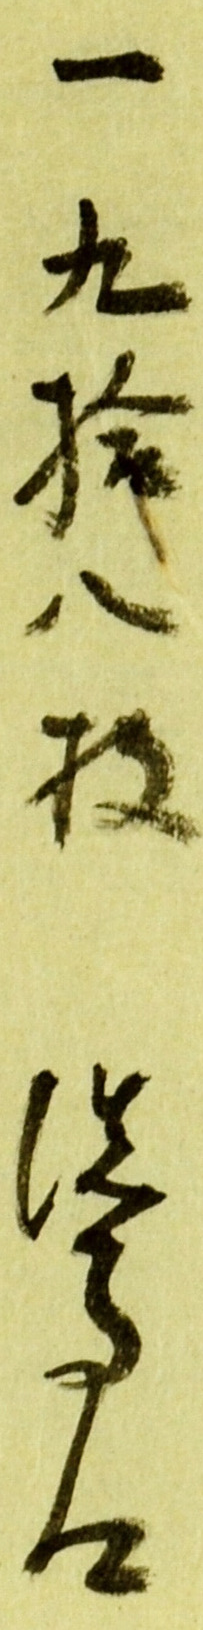一九拾八枚洗馬郷
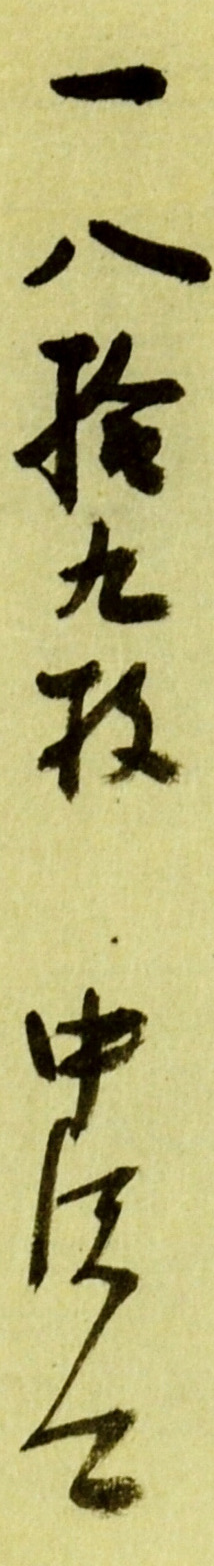一八拾九枚中沢郷
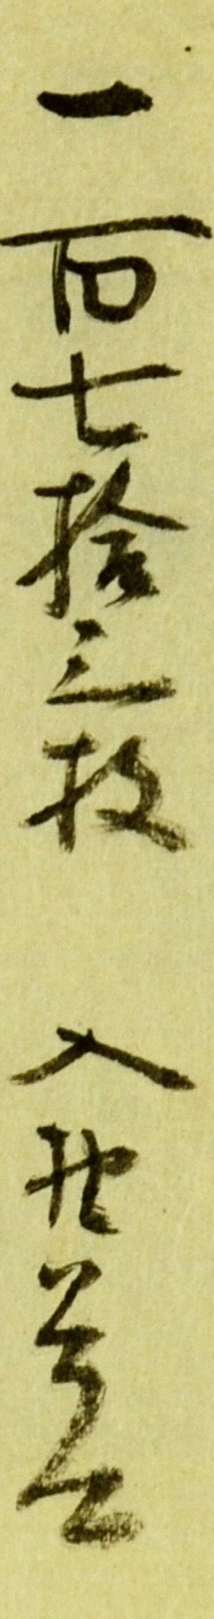一百七拾三枚入野谷郷
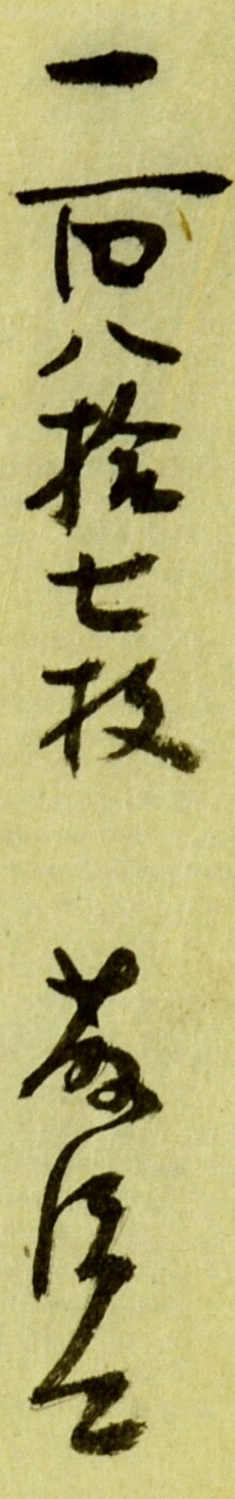一百八拾七枚藤沢郷
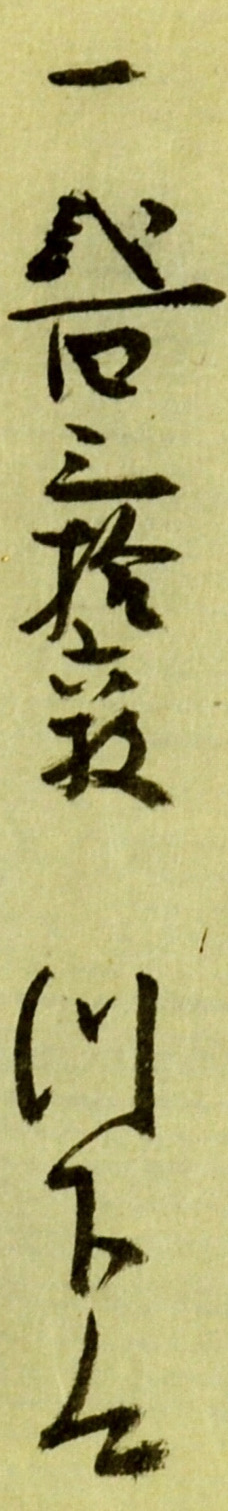一弐百三拾六枚川下郷

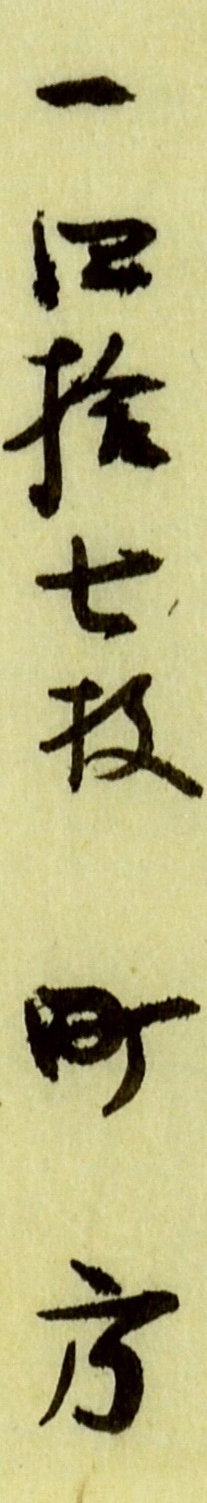一四拾七枚町方
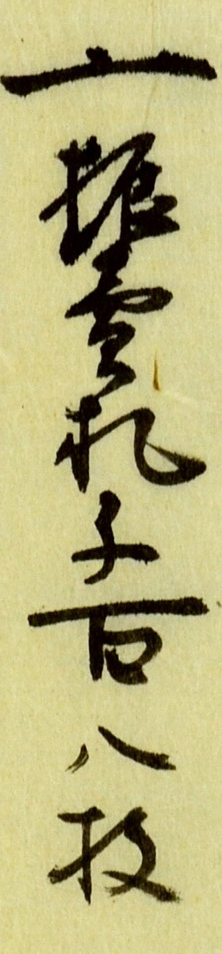〆振売札千百八枚
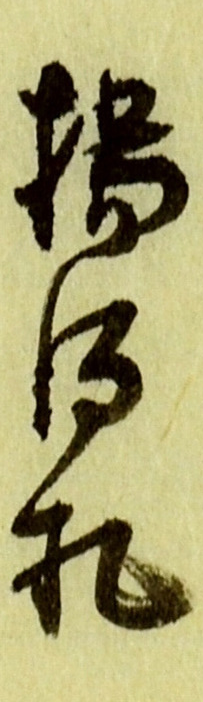揚酒札
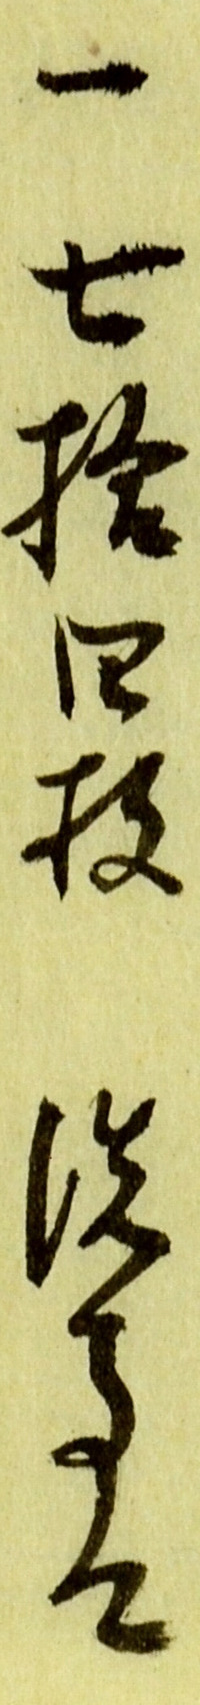一七拾四枚洗馬郷
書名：午年諸郷并町方鑑札渡覚
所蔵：伊那市立高遠町図書館・合同会社AMANE
